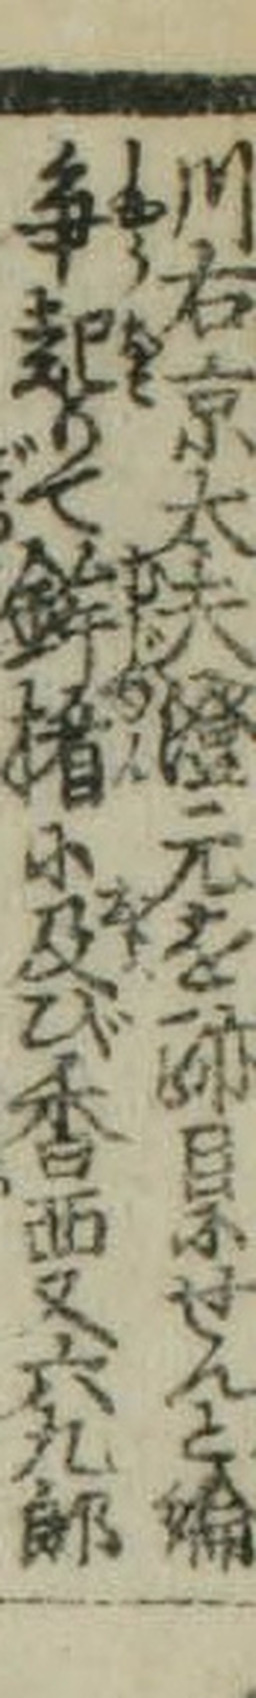争起りて鉾楯に及び香西又六九郎
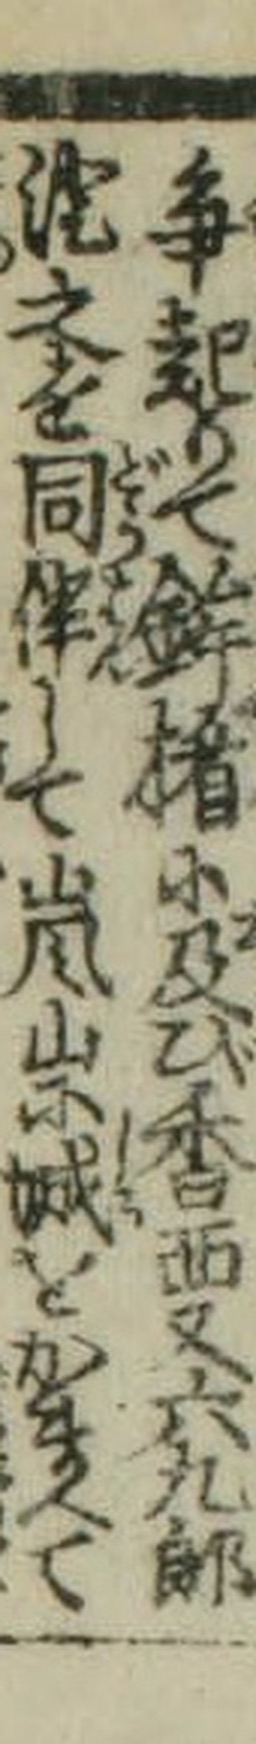澄之を同伴して嵐山に城をかまへて
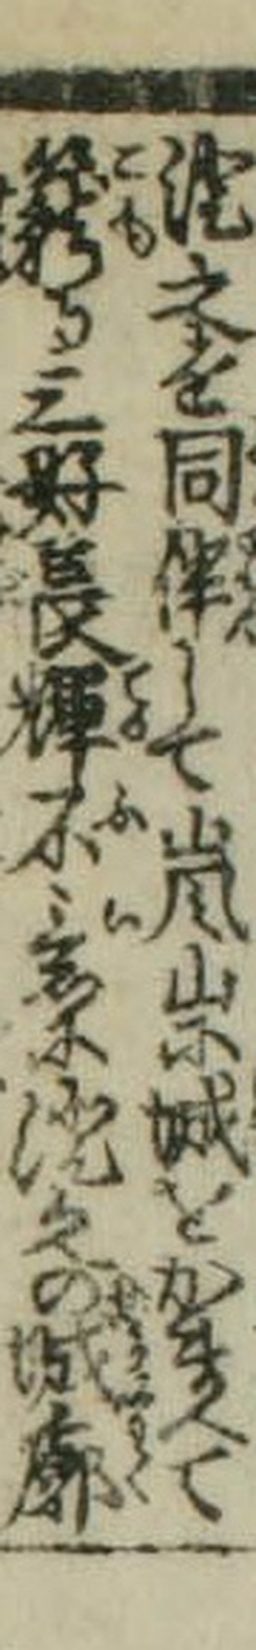籠る三好長輝不意に澄之の城郭
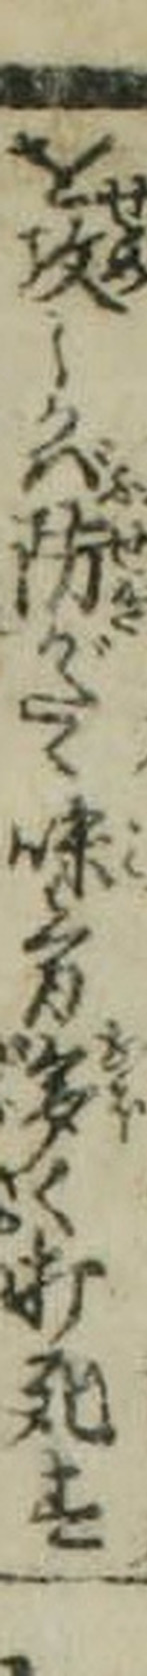を攻しかば防がたく味方多く打死す
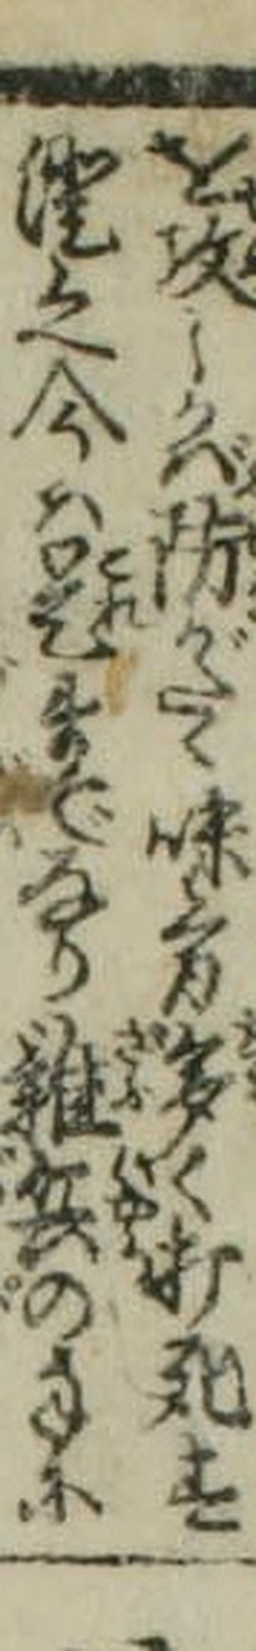澄之今は是までなり雑兵の手に
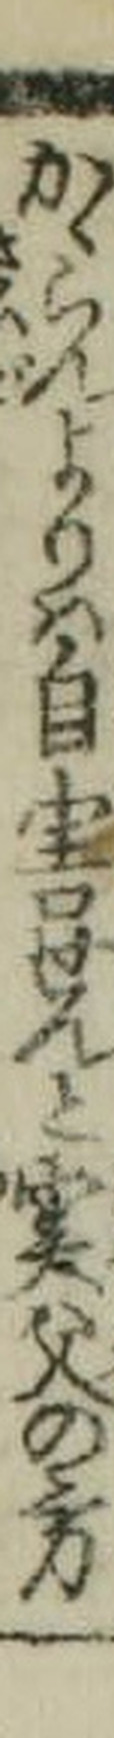かゝらんよりは自害せんと実父の方
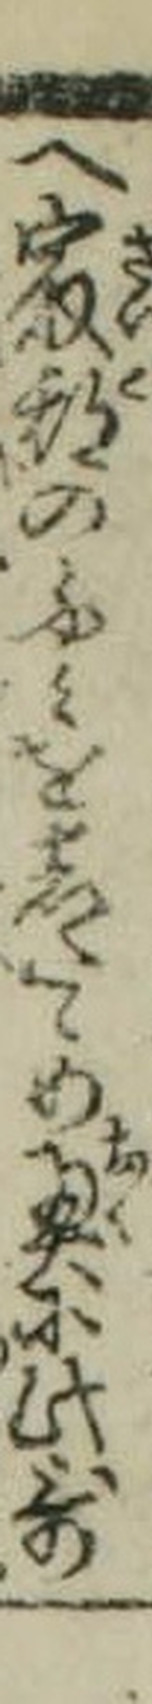へ最期のふみをしたゝめ奥に此歌
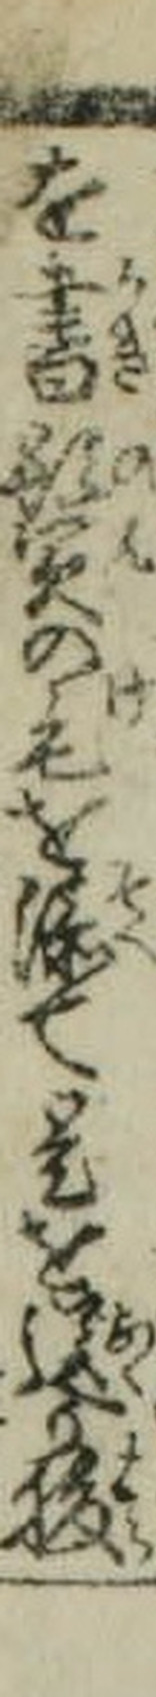を書鬢の毛を添て是を送り腹
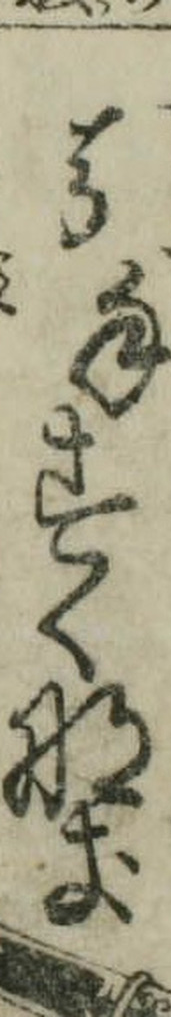引手すくなき
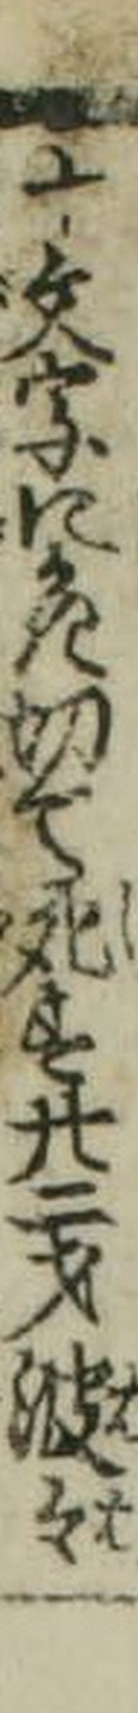十文字にかき切て死す廿二才波々
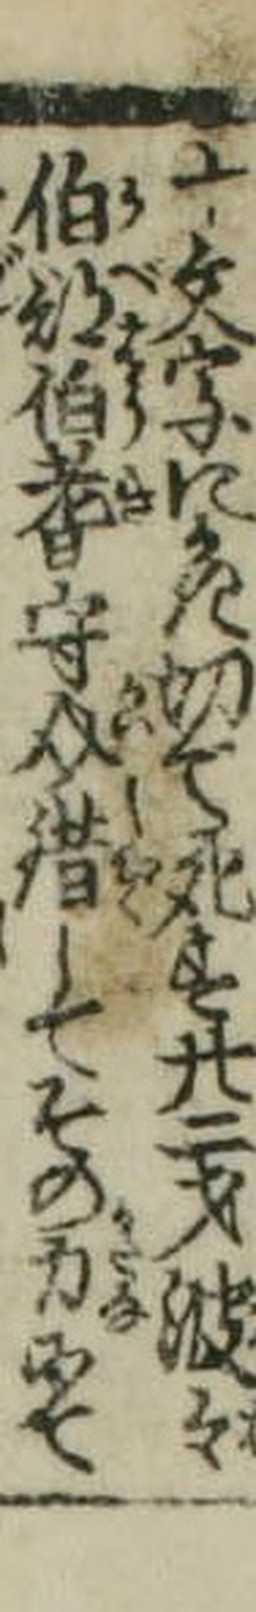伯部伯耆守介錯してその刀にて
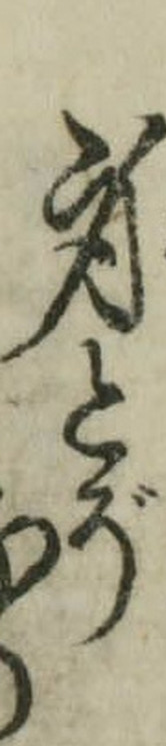身とぞ
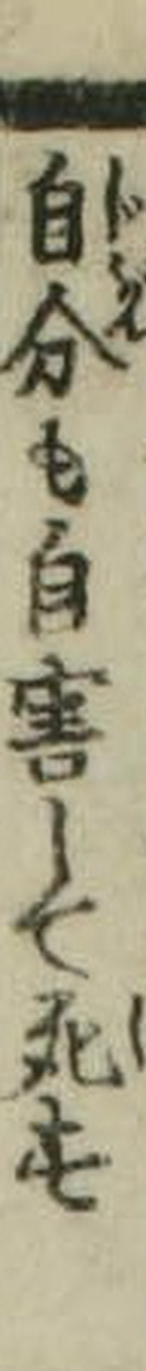自分も自害して死す
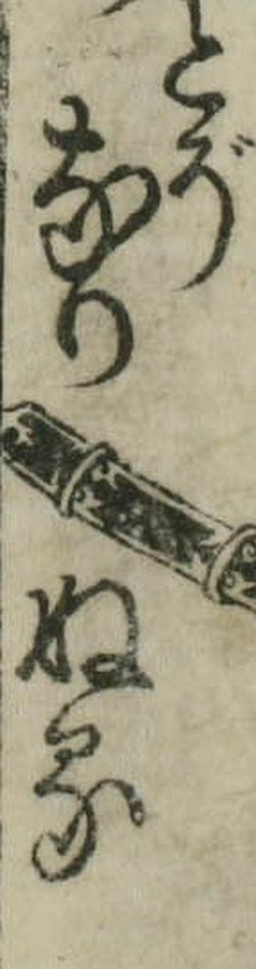なりぬる
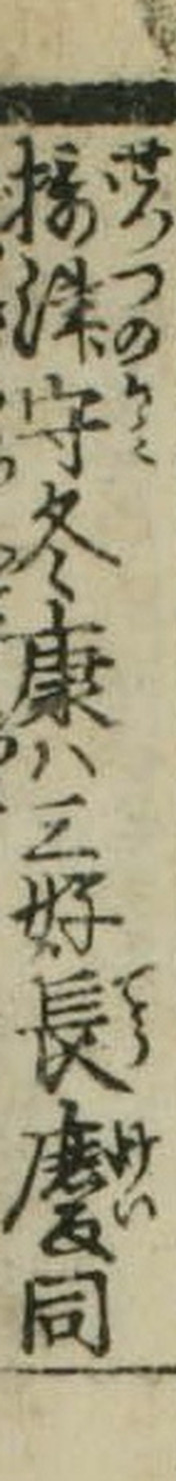摂津守冬康は三好長慶同
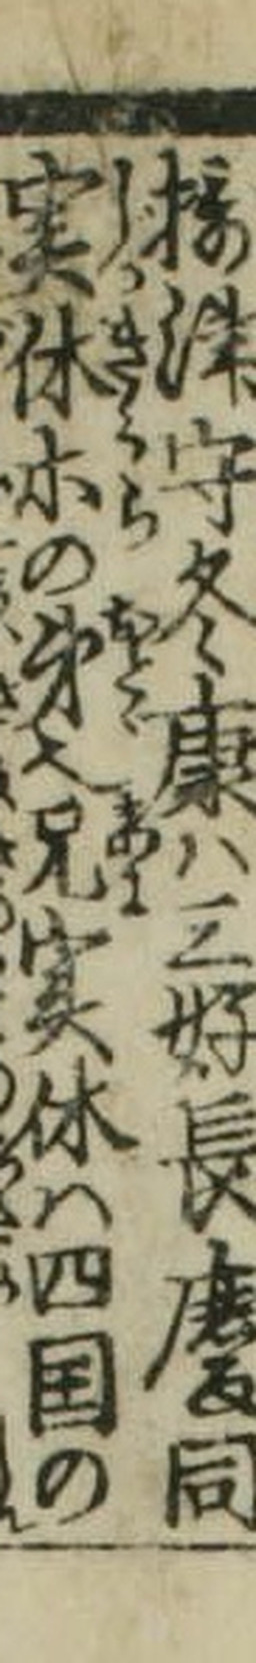実休等の弟也兄実休は四国の
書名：續英雄百人一首
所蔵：東京学芸大学附属図書館
